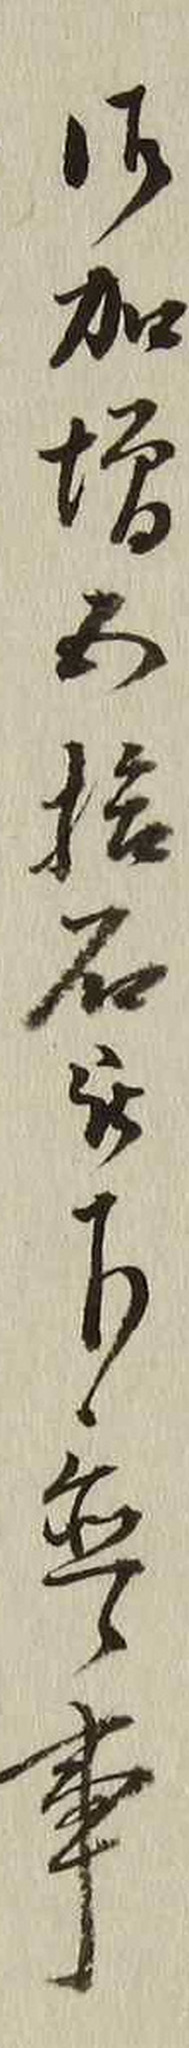御加増五拾石被下置事
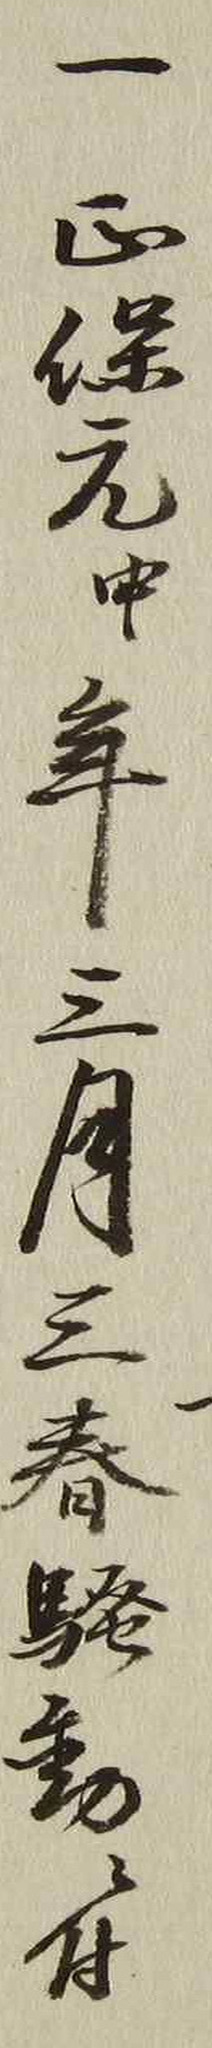一正保元申年三月三春騒動ニ付
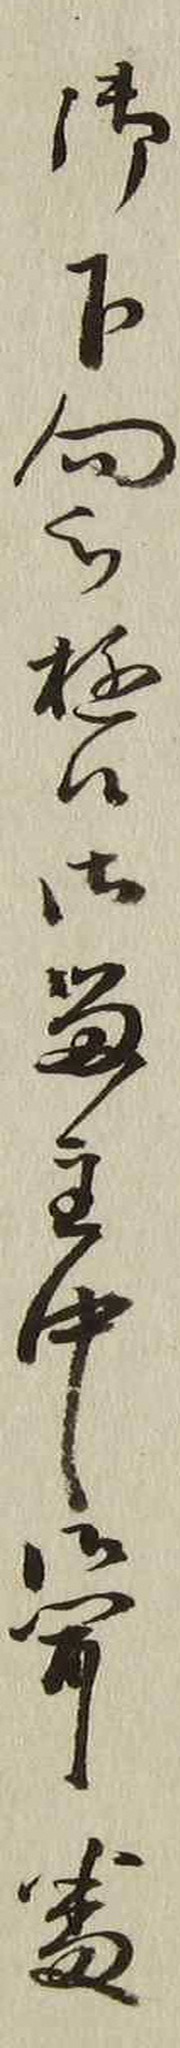御下向被遊候御留主中御聞番
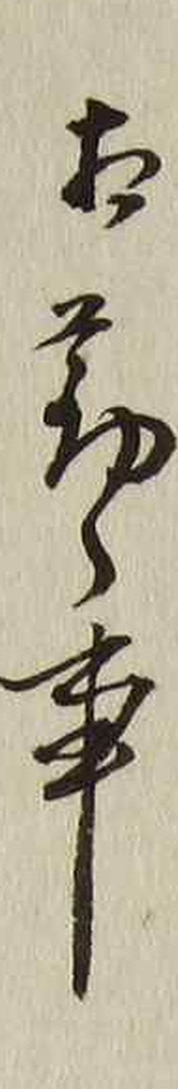相勤候事
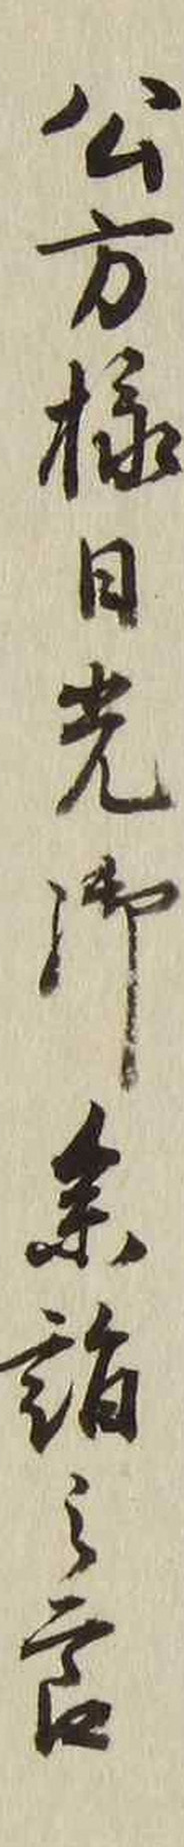公方様日光御参詣之節
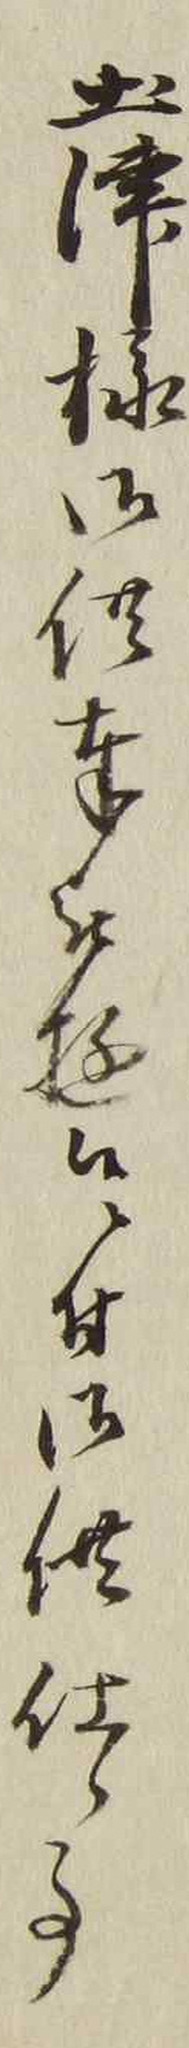土津様御供奉被遊候ニ付御供仕候事

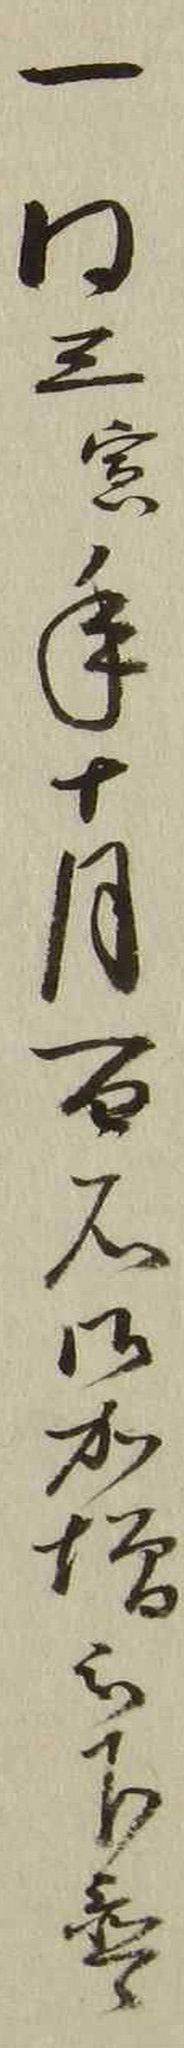一同三寅年十月百石御加増被下置候
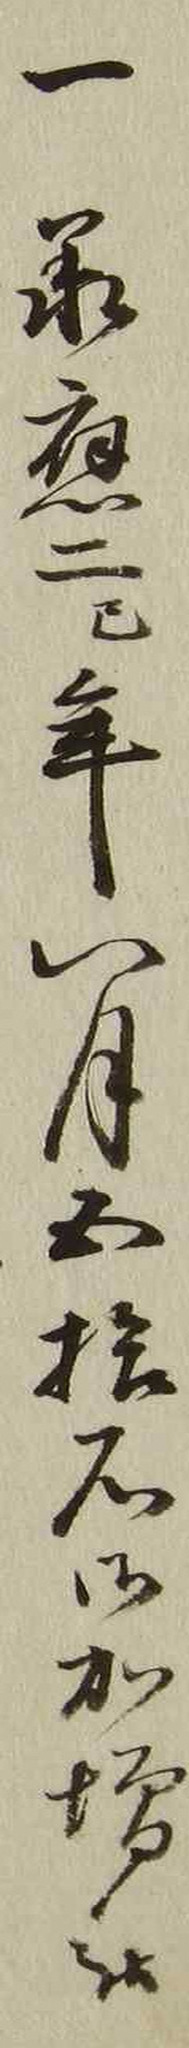一承応二巳年八月五拾石御加増被
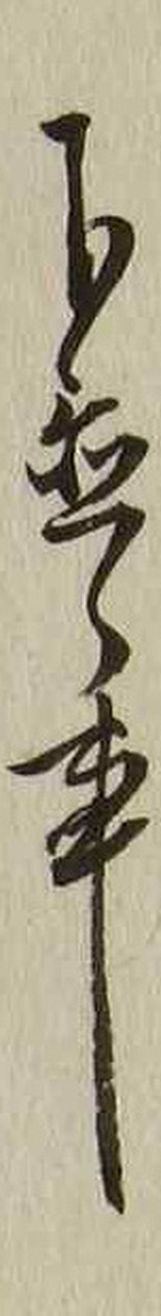下置候事
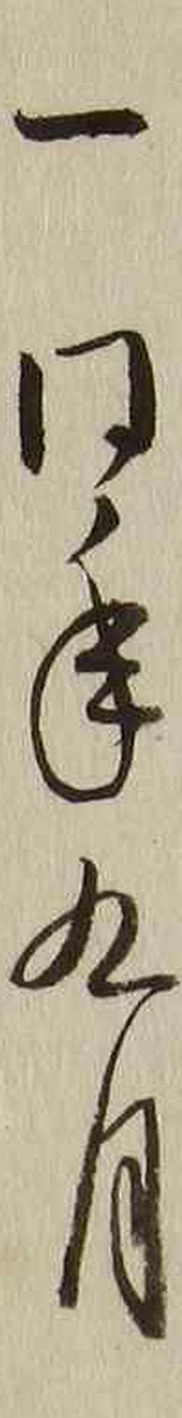一同年九月
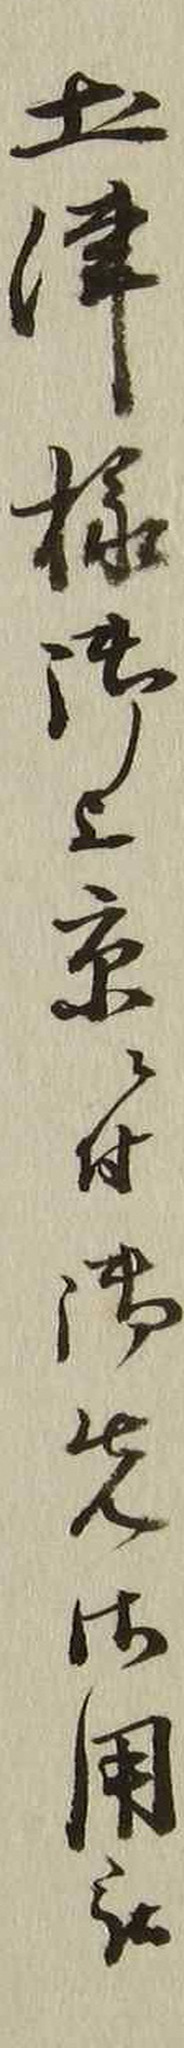土津様御上京ニ付御先御用被
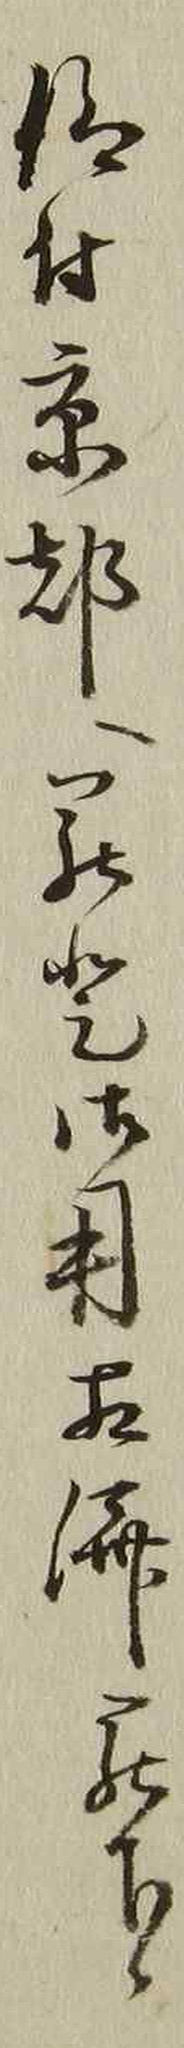仰付京都へ罷登御用相済罷下候
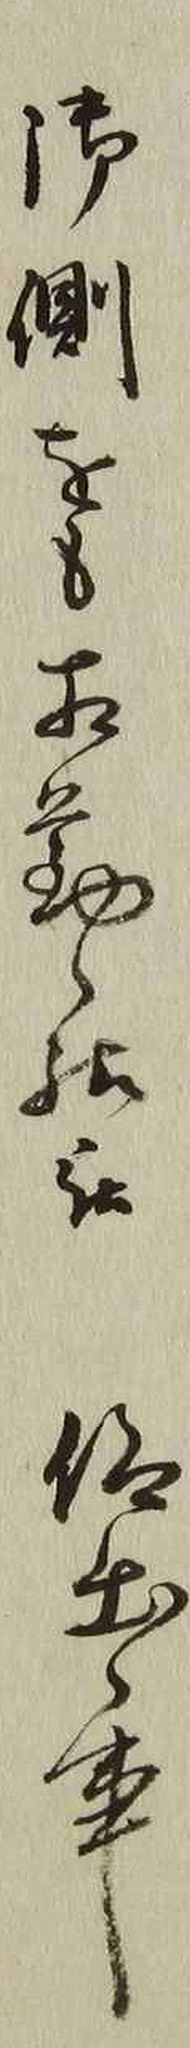御側をも相勤候様被仰出候事
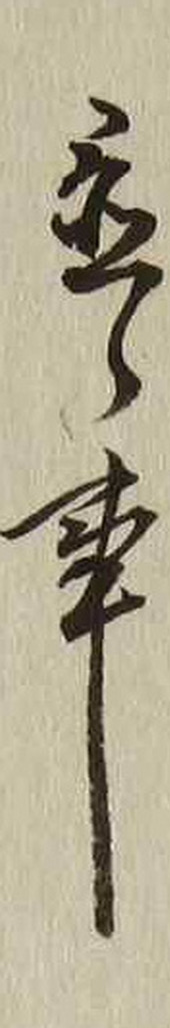置候事
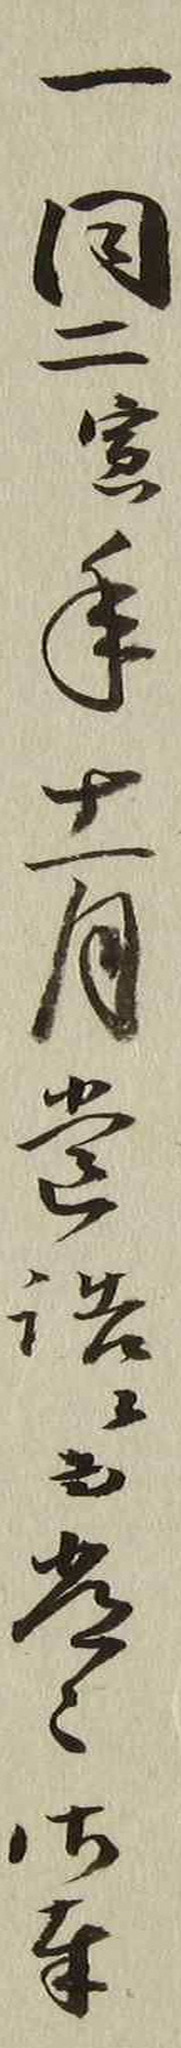一同二寅年十一月常詰ニ而常々御奉
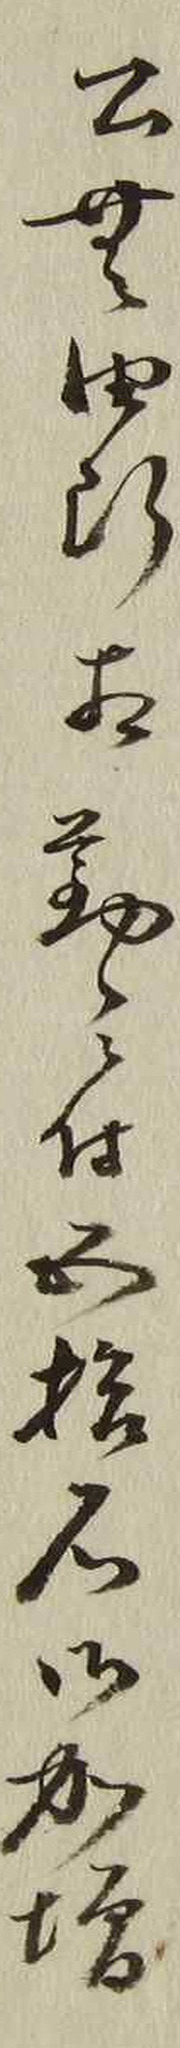公無由断相勤候ニ付五拾石御加増
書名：諸士系譜　巻之69　を之部3
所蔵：会津若松市立会津図書館
